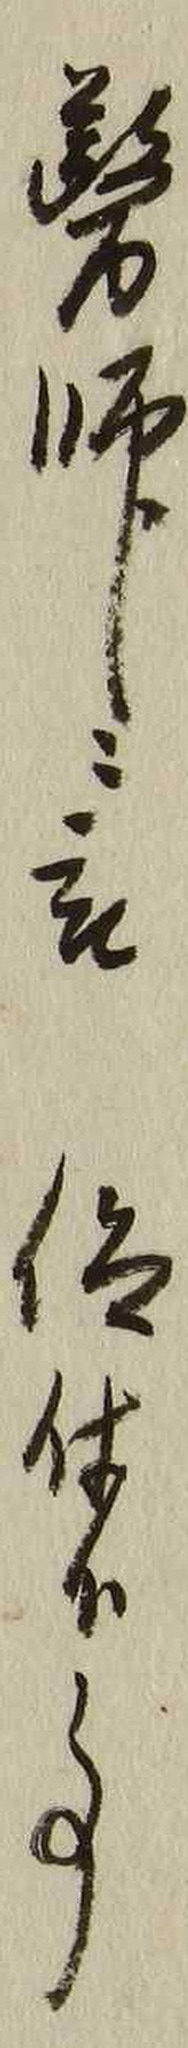医師ニ被仰付候事
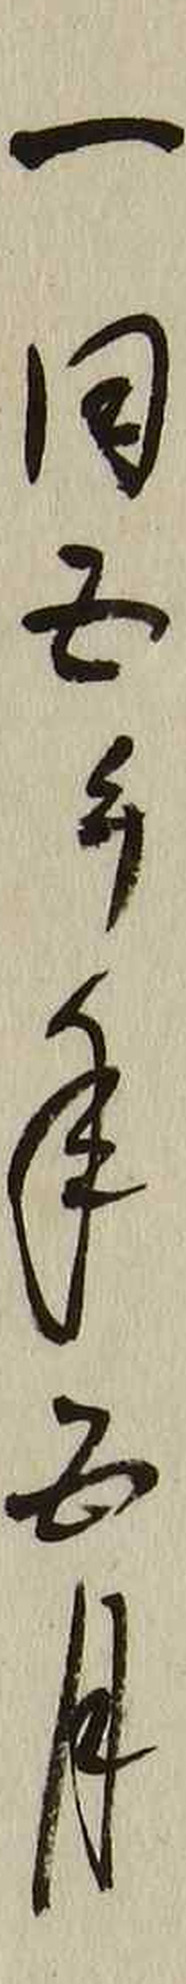一同五午年五月
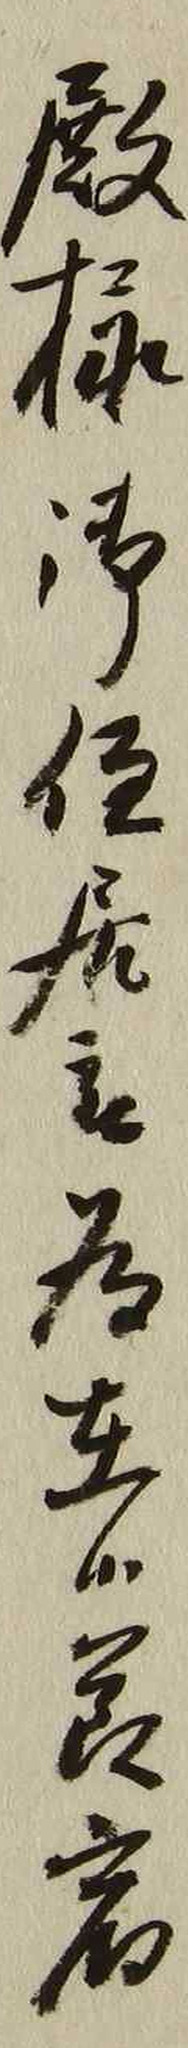殿様御住居被為在候節宿
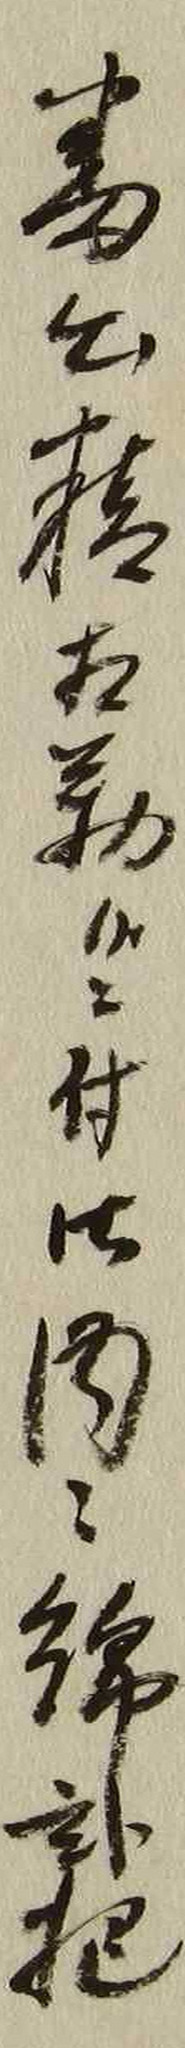番出精相勤候ニ付御内々綿弐把
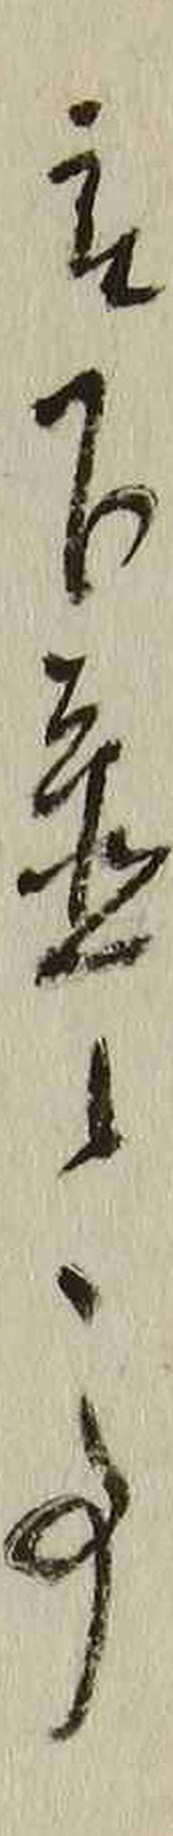被下置候事
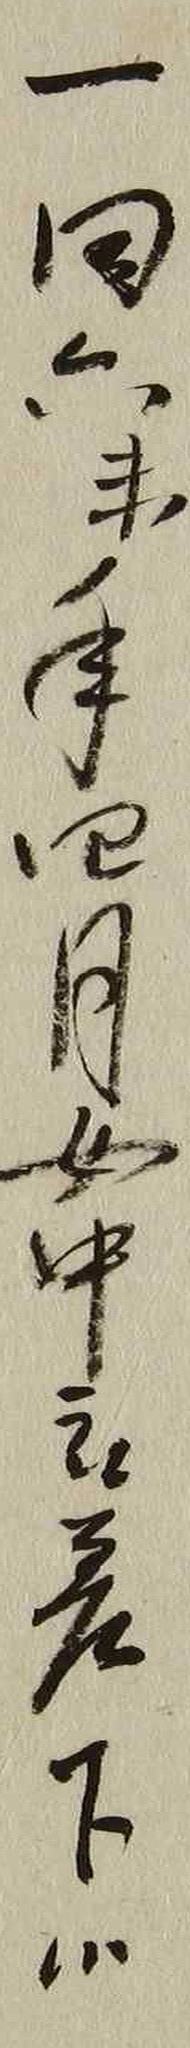一同六未四月女中被差下候
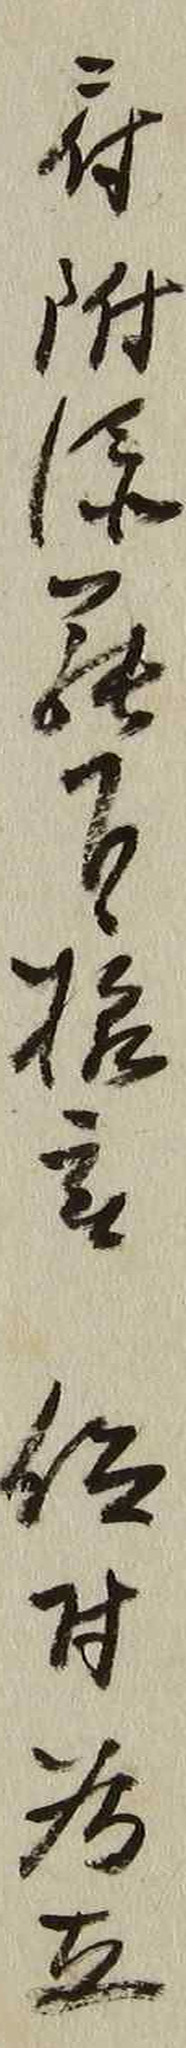ニ付附添罷下候様被仰付為立
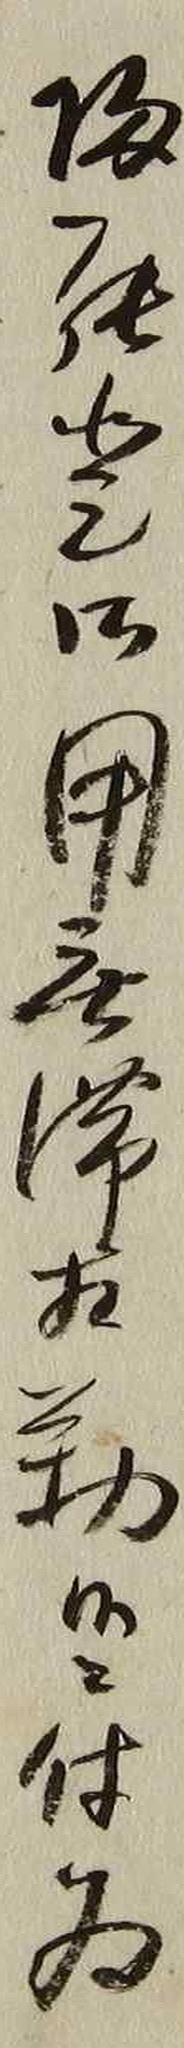帰罷登御用無滞相勤候ニ付為
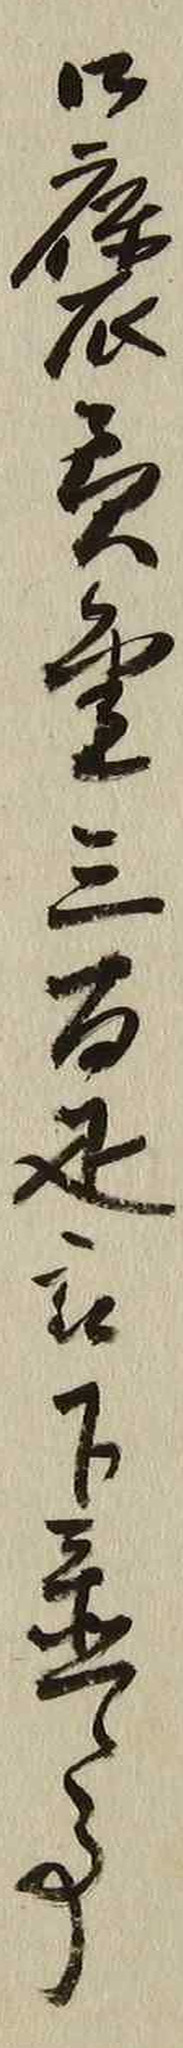御褒美金三百疋被下置候事
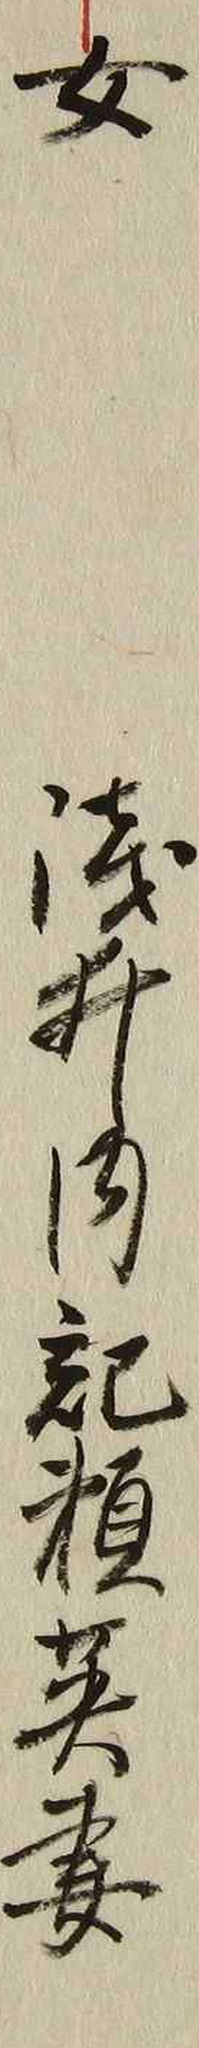女浅井内記頼英妻
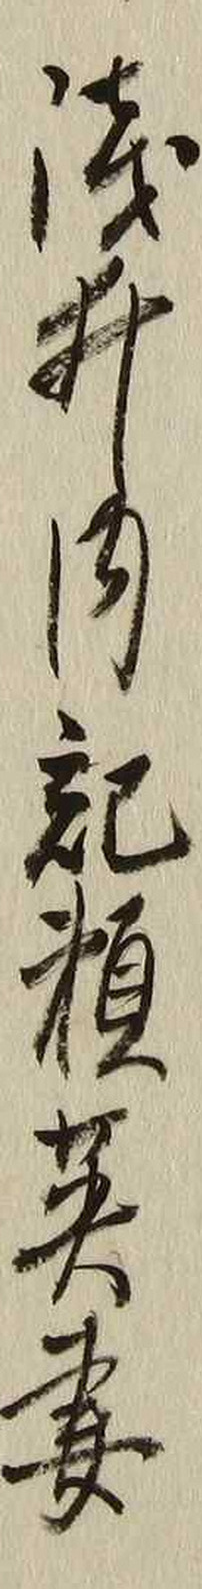女浅井内記頼英妻
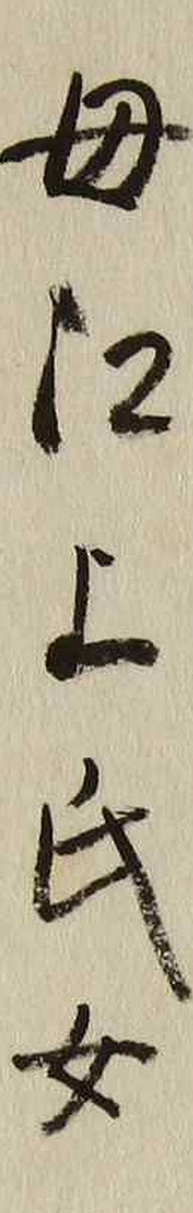母江上氏女
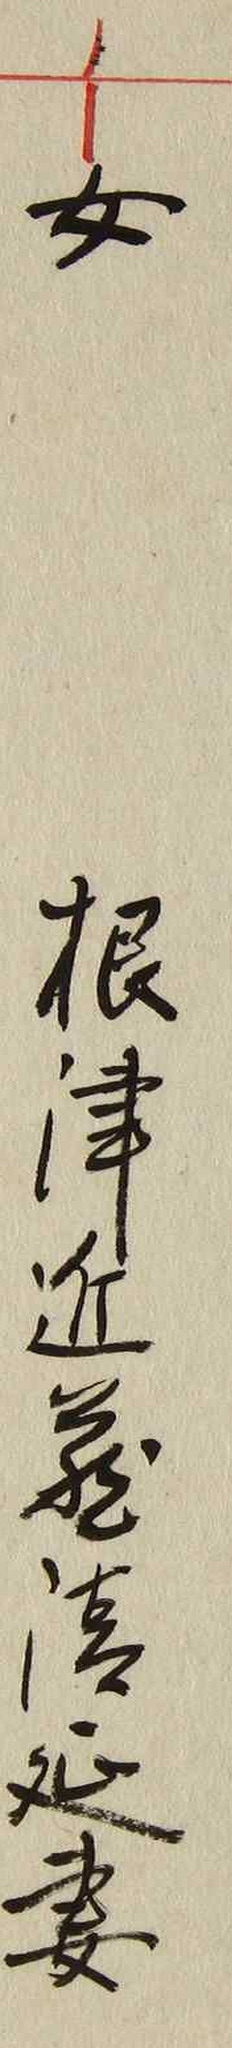女根津近蔵清延妻
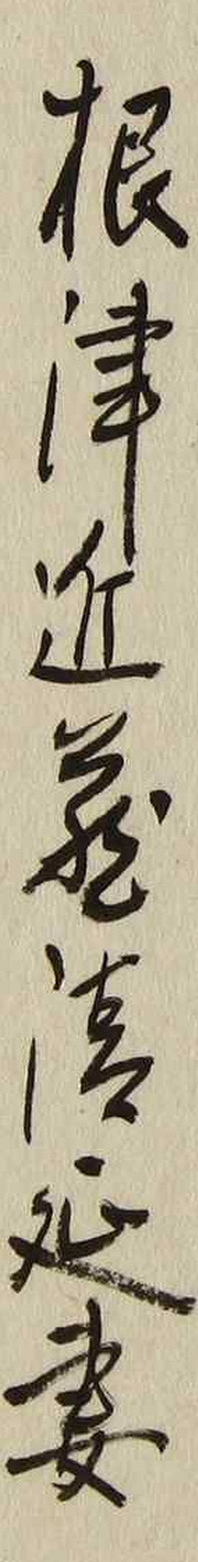女根津近蔵清延妻
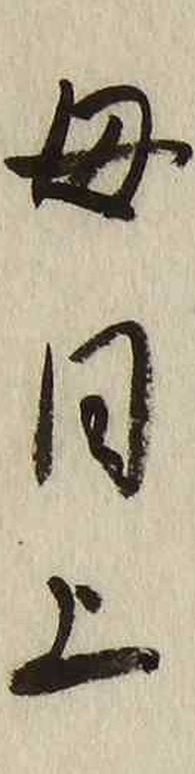母同上

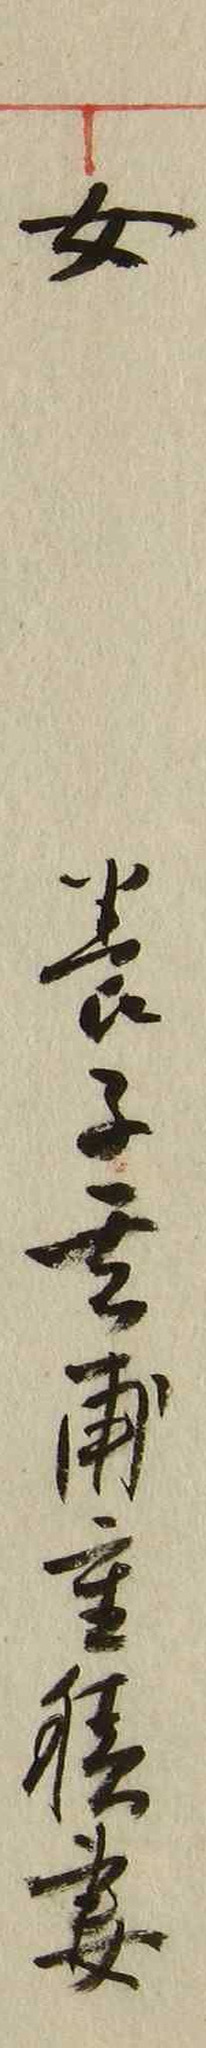女養子玄甫重積妻
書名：諸士系譜　巻之353　す之部3
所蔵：会津若松市立会津図書館
